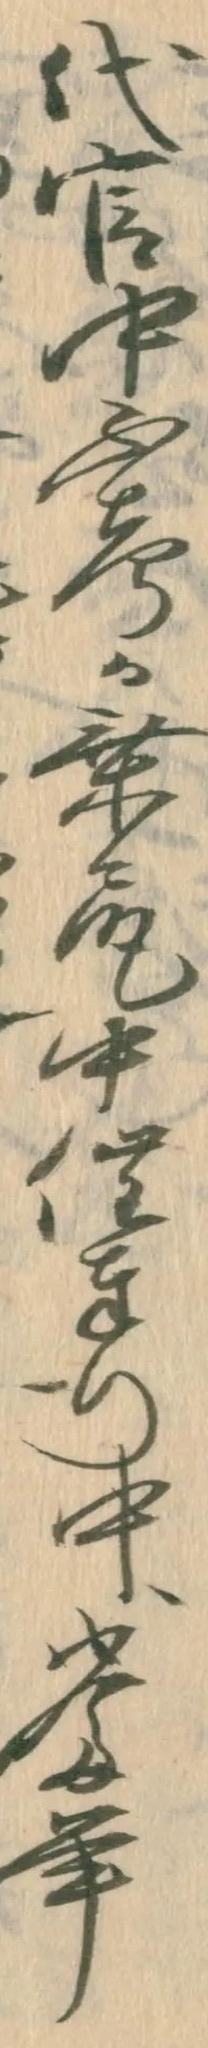代官中不考か乗尻中催奉行中へ当年
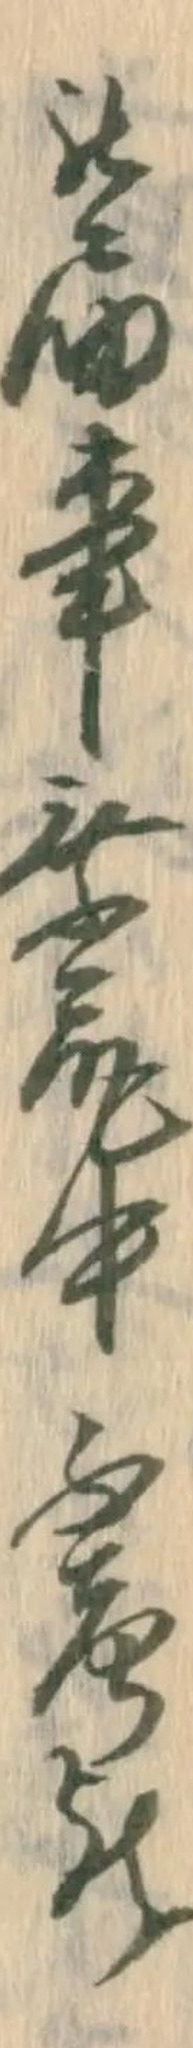被届事乗尻中不考歟
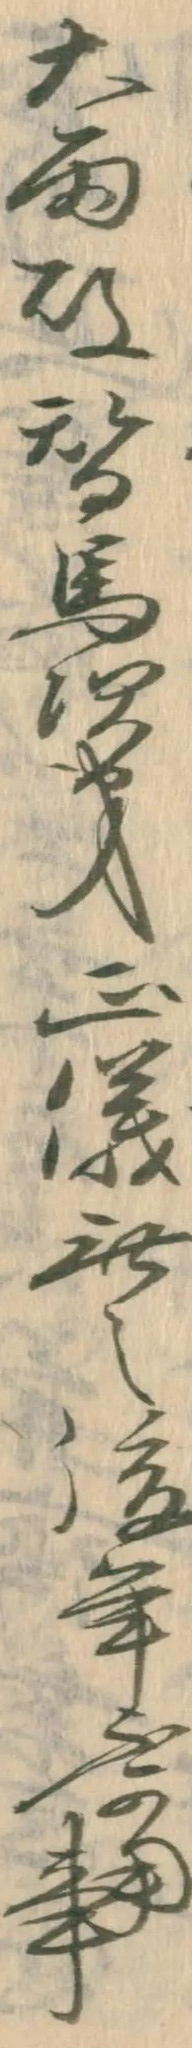大雨故替馬次第正儀無之後年不可用事
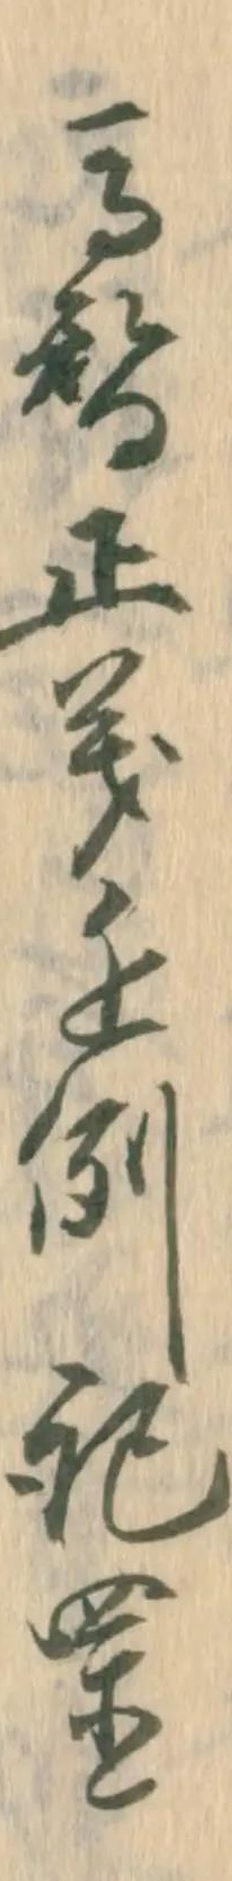一馬替正義近例記置
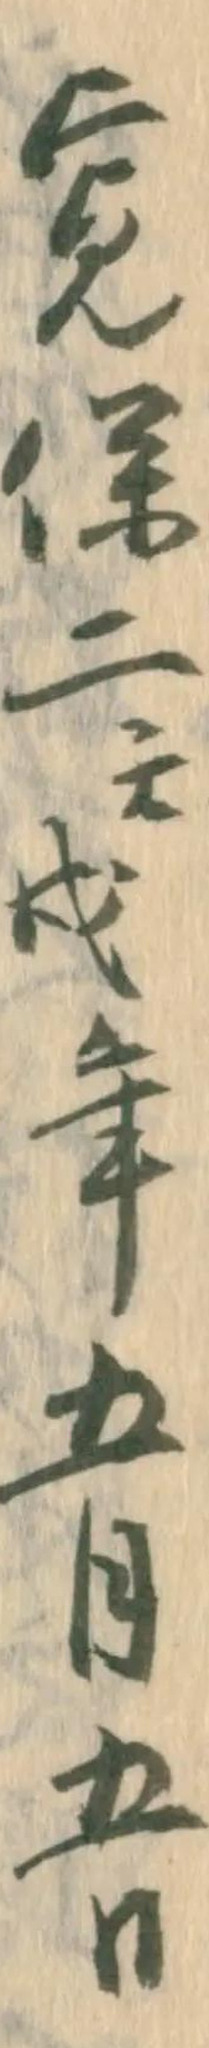寛保二壬戌年五月五日
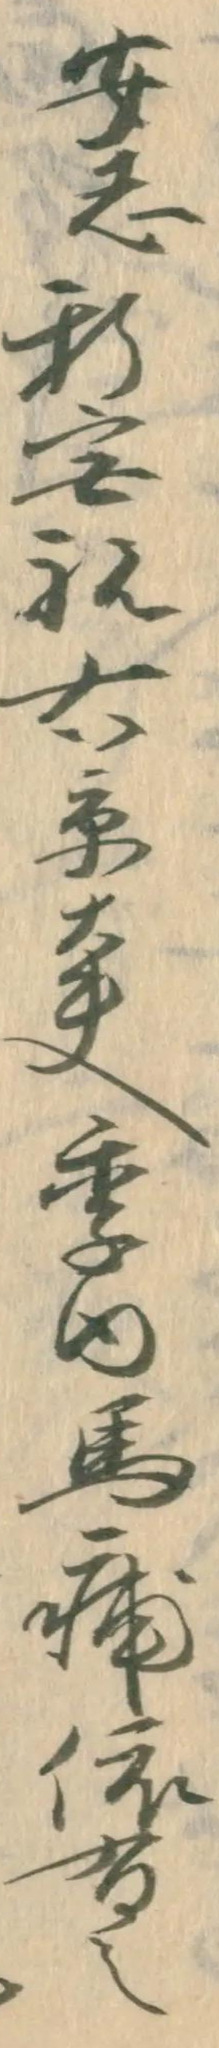安志新宮祝右京大夫季内馬痛依有之
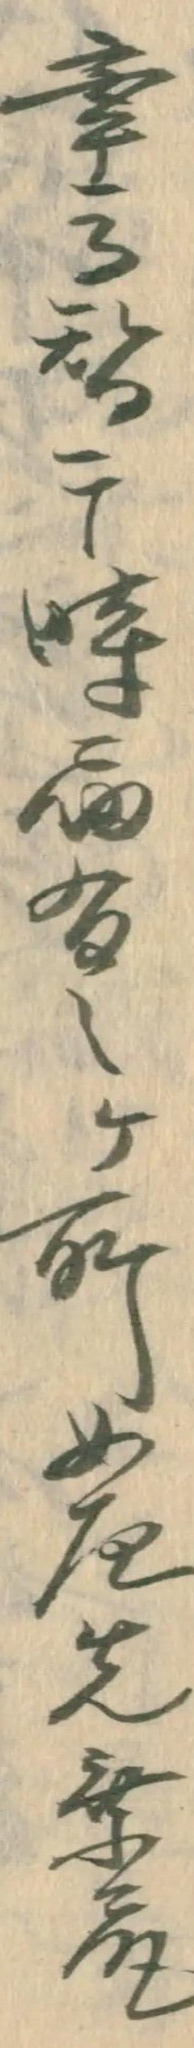牽馬替于時届有之ケ所如左先乗尻
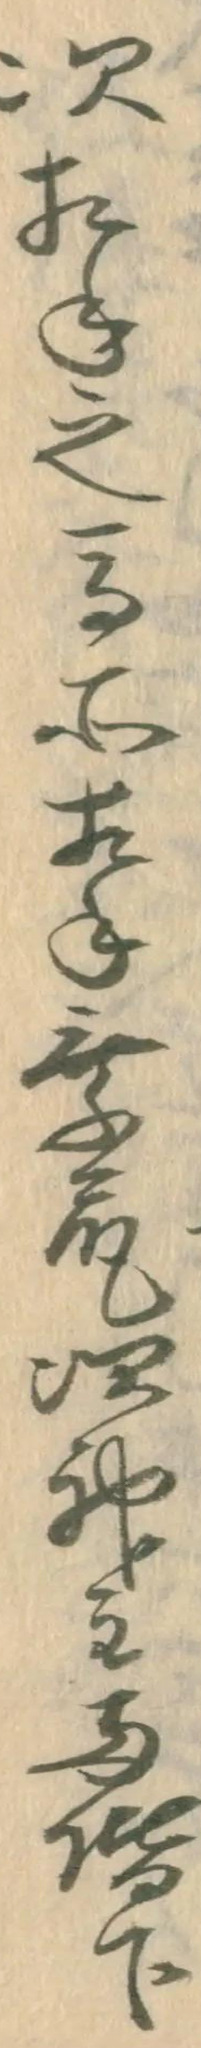次相手之馬所相手乗尻次神主両階下

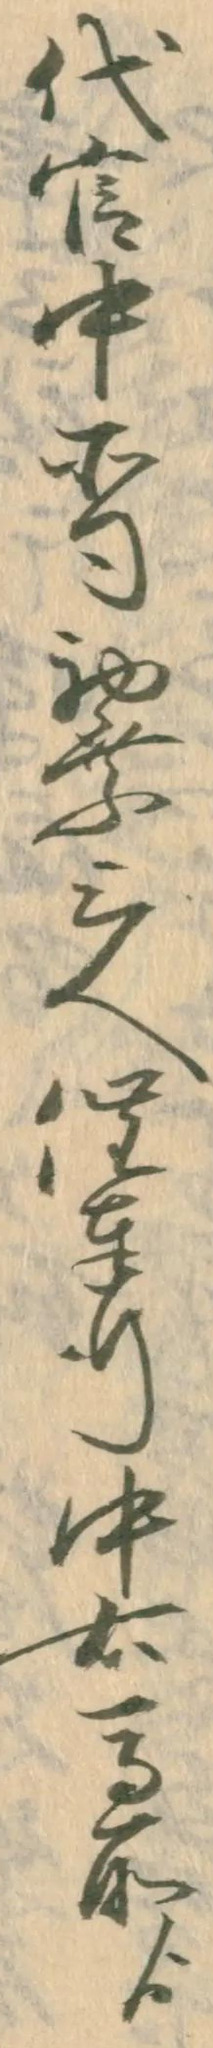代官中所司初乗三人催奉行中右馬所ゟ
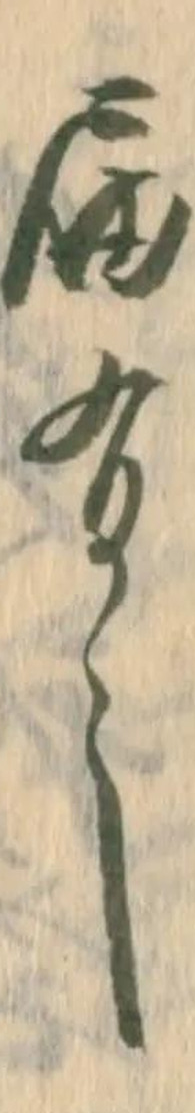届有之
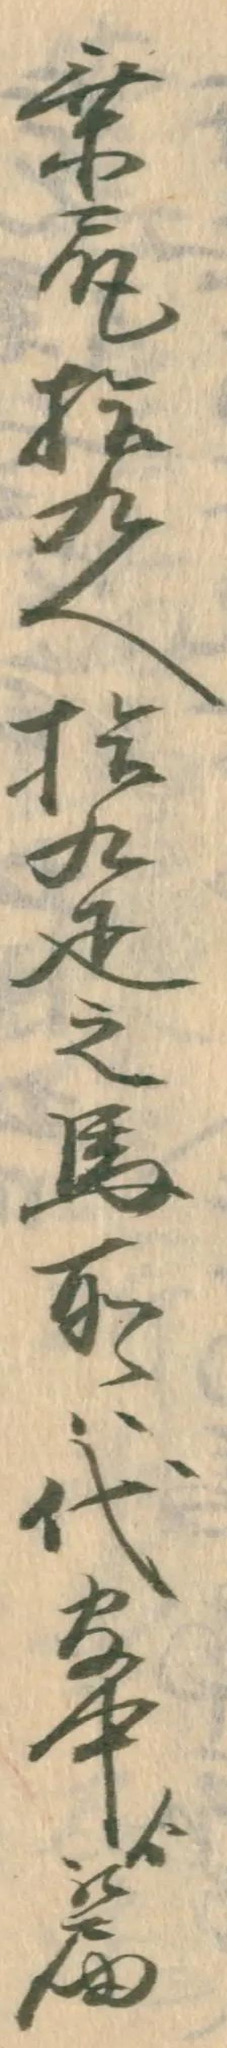乗尻拾九人拾九疋之馬所候ハ代官中ゟ被届
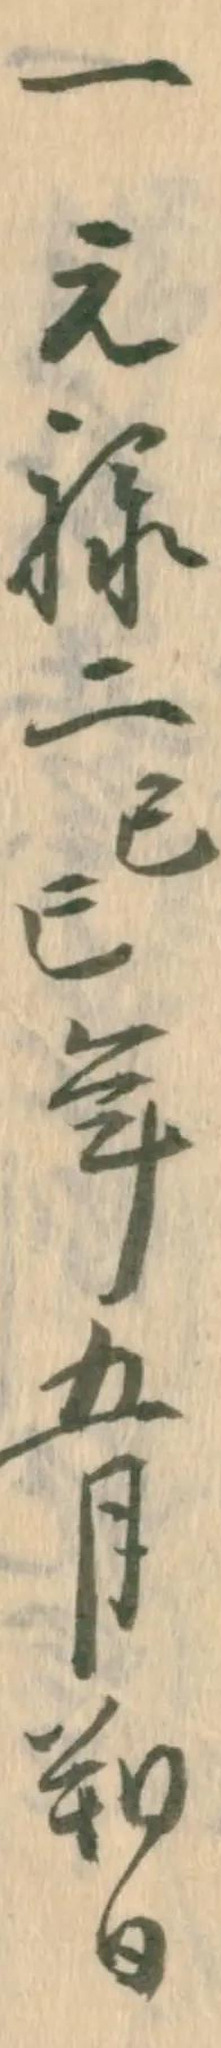一元禄二己巳年五月朔日
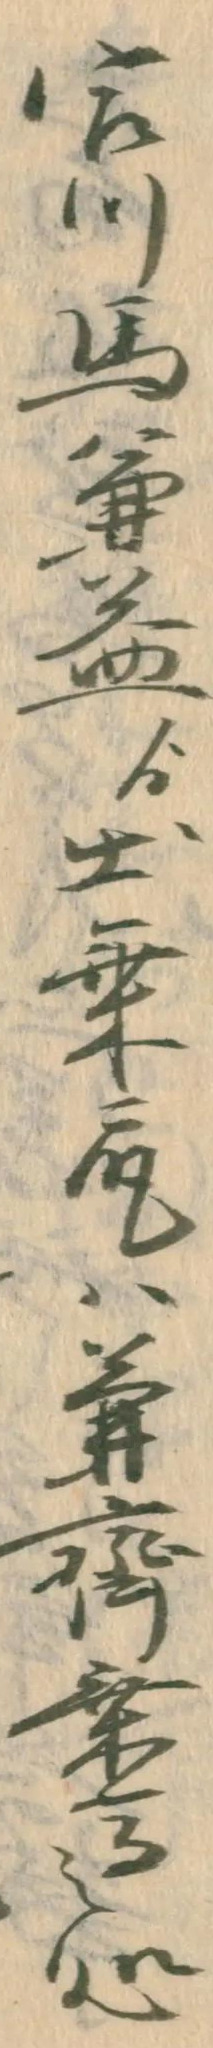宮川馬兼益ゟ出乗尻ハ兼斉乗馬之処
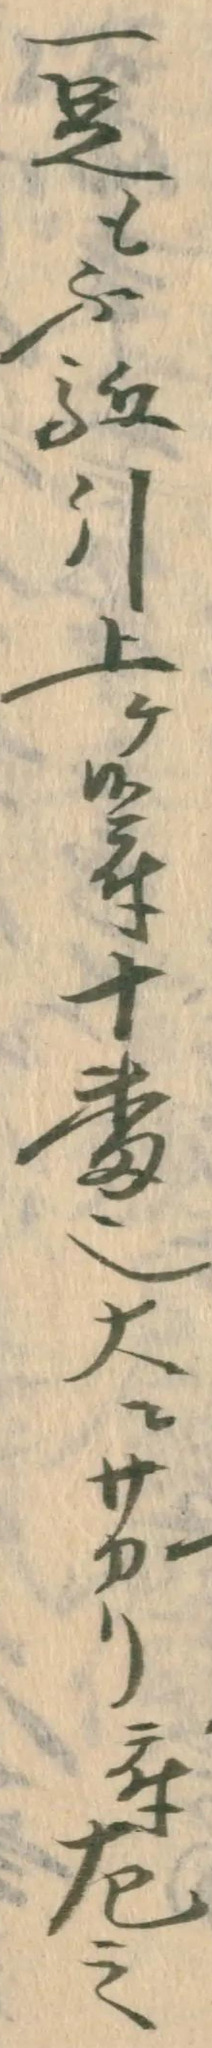一足も不駆引上ケ候ニ付十番也大ニサカリニ付左之
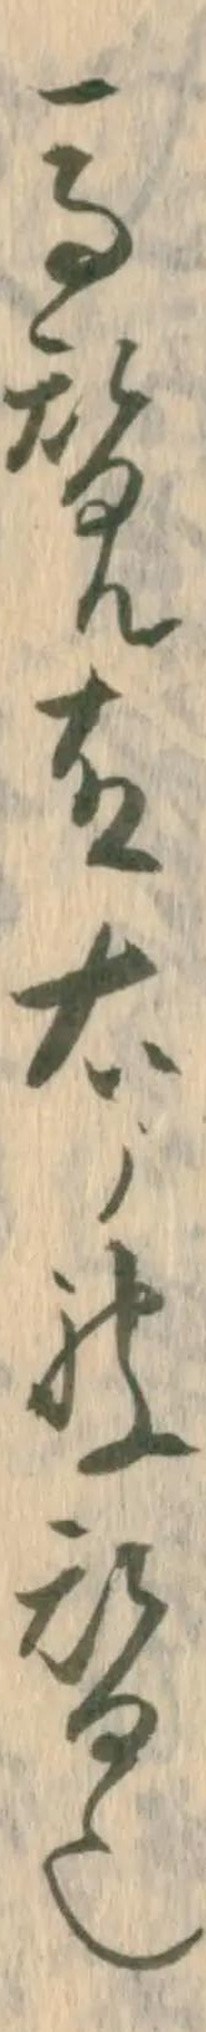馬替ル故右ノ被替也
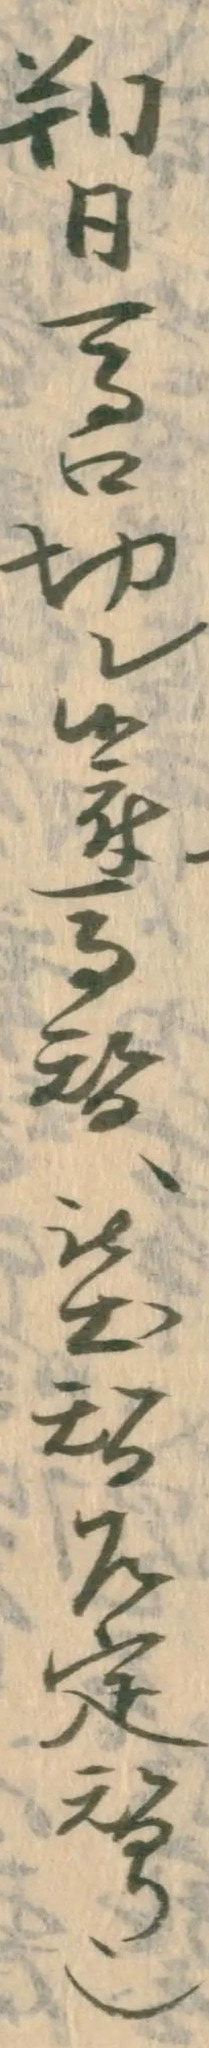朔日馬口切レ候ニ付馬替へ被出替乍定替り也
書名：賀茂社記録. 第12冊
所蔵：国立国会図書館 National Diet Library, JAPAN
